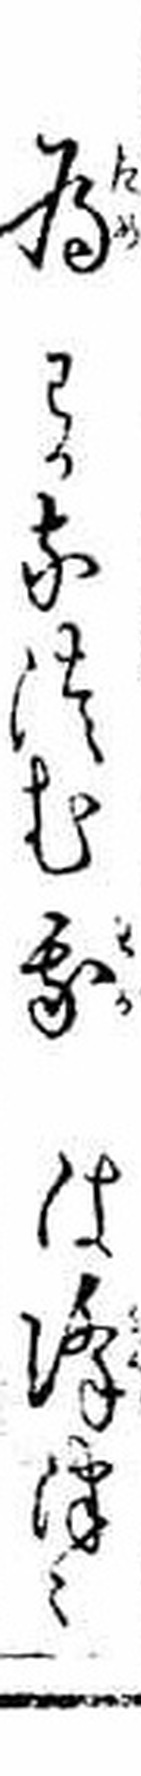為わかなつむ我は降つゝ
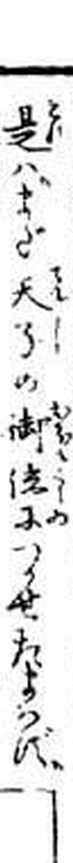これは天子の御位につかせたまはず
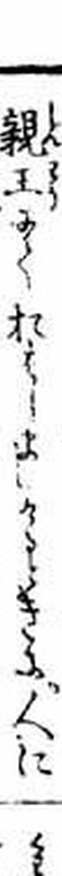親王にておはしましけるときに人に
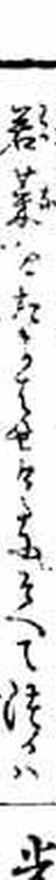若菜をたまはせけるにそへてつかは光
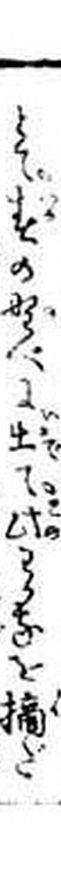とて春の野べに出て此わかなを摘だ
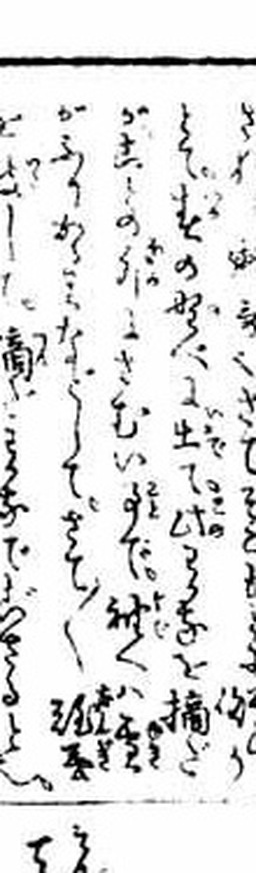がことの外にさむい事で袖は雪
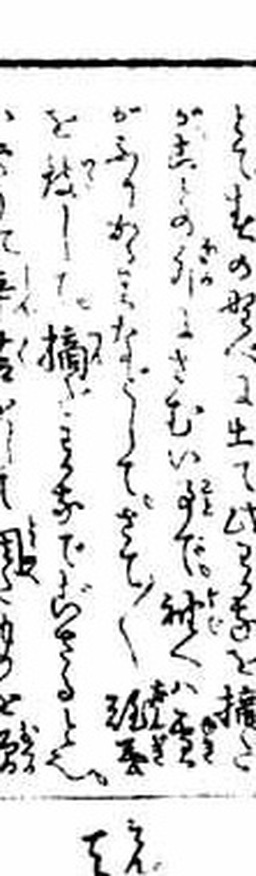がふりかゝりなどしてさて〳〵難儀天
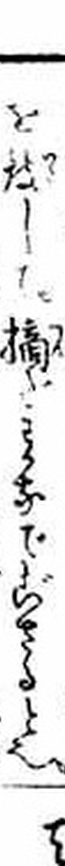を致して摘だわかなでござると也皇
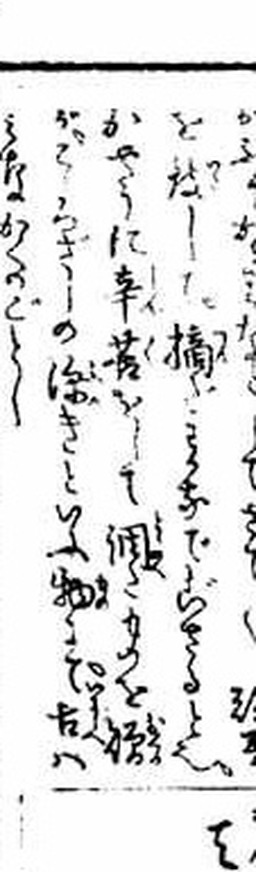かやうに辛苦をして調えたものを贈る
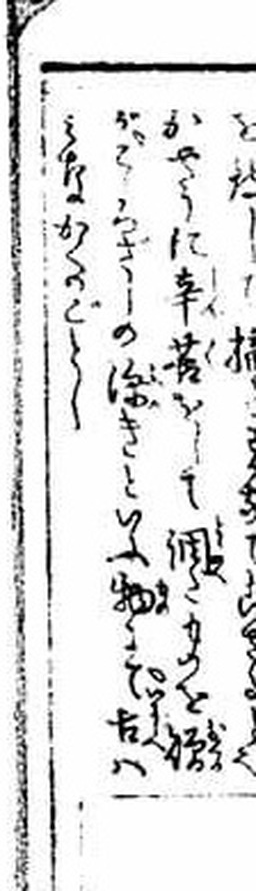がこゝろざしの深きといふ物にて古は
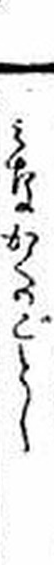みなかくのごとし

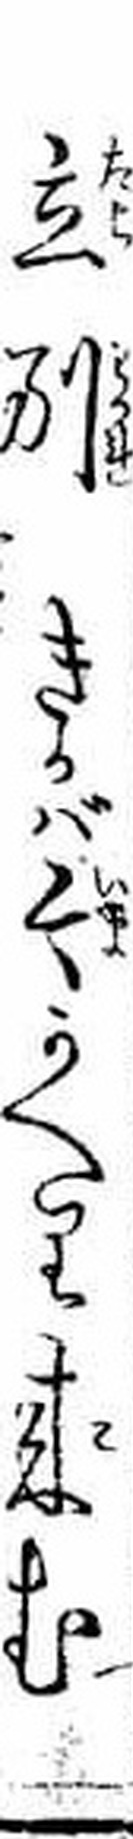立別きかば今かへり来るむ
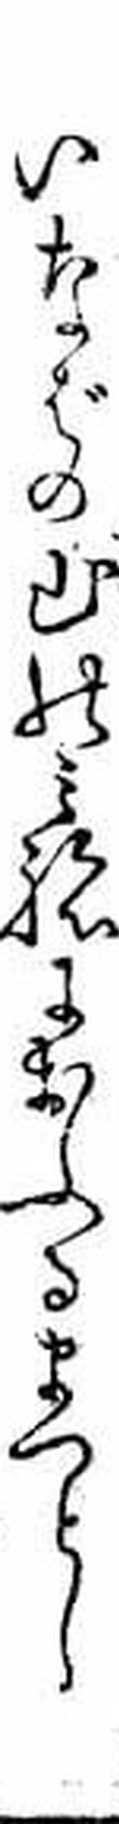いなばの山のみねにおふるまつとし
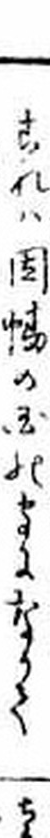これは因幡の国の守になりて
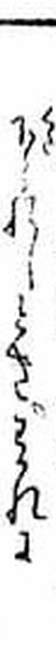下られしときわかれに中
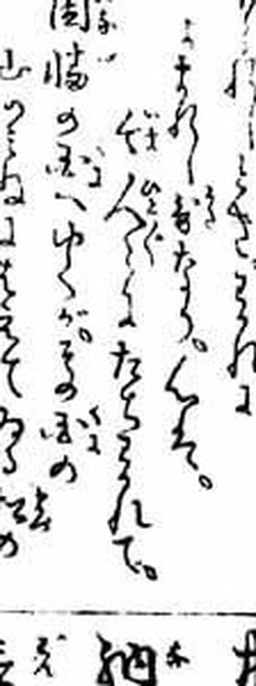今人々とにたちわかれて納
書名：小倉百人一首
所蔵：東京学芸大学教育コンテンツアーカイブ
